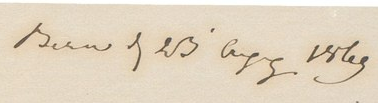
Bern den 23t App 1869.
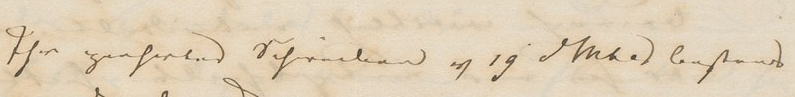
Ihr geehrtes Schreiben vom 19t dMts bestens
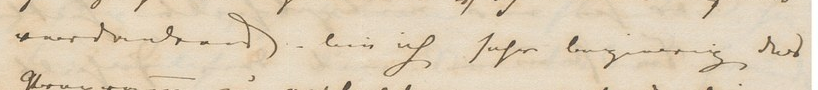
verdankend – bin ich sehr begierig das
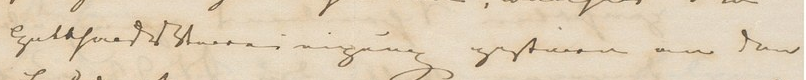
GotthardVereinigung gestern an den
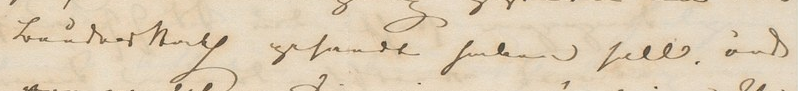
BundesRath gesandt haben soll – und
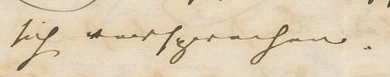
sich versprechen.
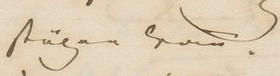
stüzen kann. –
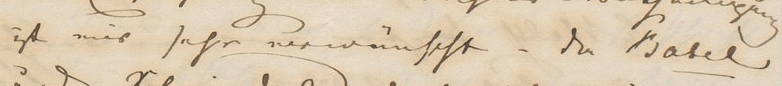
ist mir sehr erwünscht – da Basel
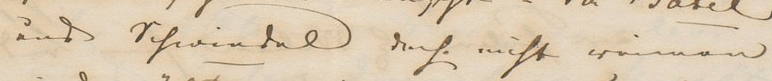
und Schwindel doch nicht reimen
